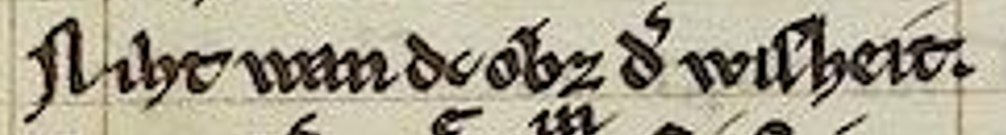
Niht wan d(az) obz d(er) wiſheit.
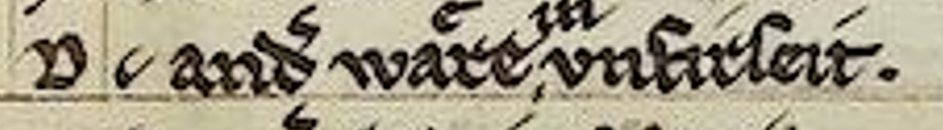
D(az) and(er) wa°re °(in) vnfirſeit.
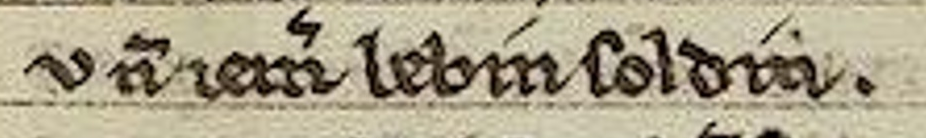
Vn(d) iem(er) lebin ſoldin.
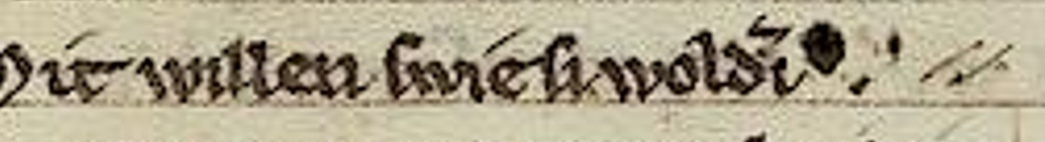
Mit willen ſwie ſi woldi(n).
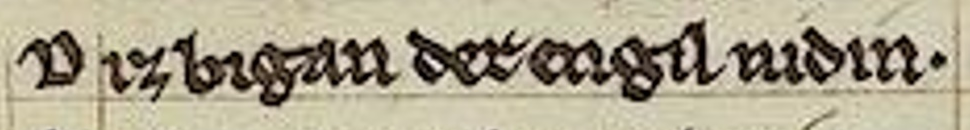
Diz bigan der engil nidin.
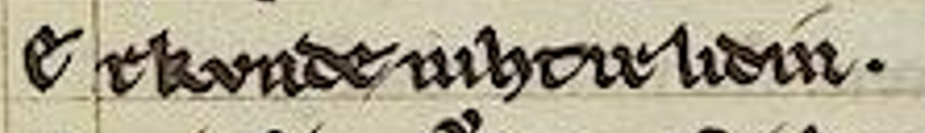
Er kvnde niht ir lidin.
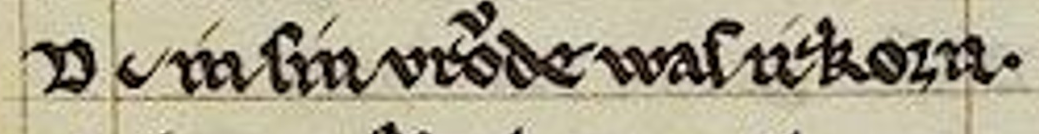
D(az) in ſin vro°vde waſ irkorn.
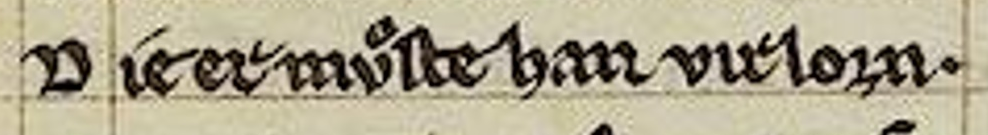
Die er mv°oſte han virlorn.
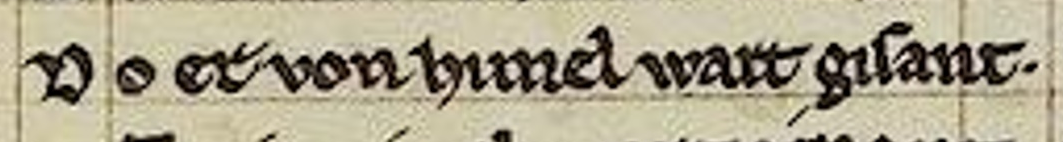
Do er von himel wart giſant.
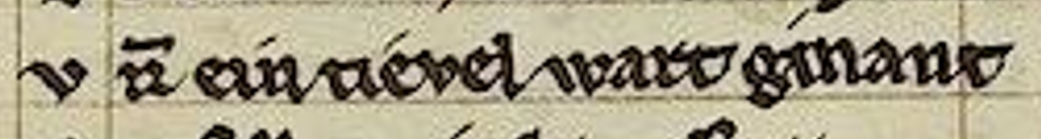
Vn(d) ein tievel wart ginant
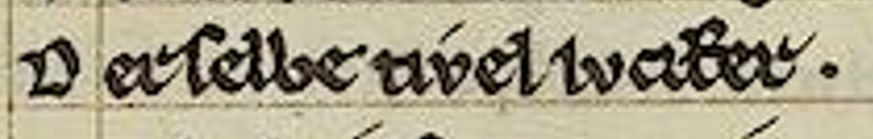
Derſelbe tivel lvcifer.
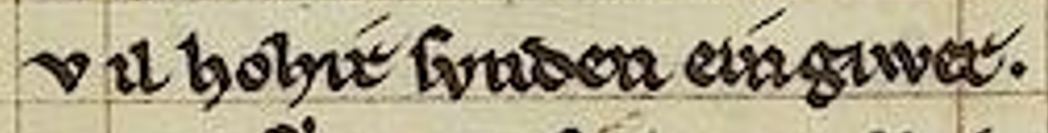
Vil hohir ſvnden ein giwer.
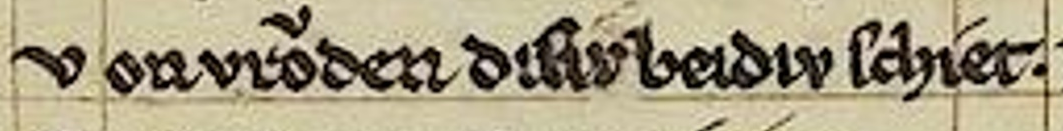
Von vro°vden diſiv beidiv ſchiet.
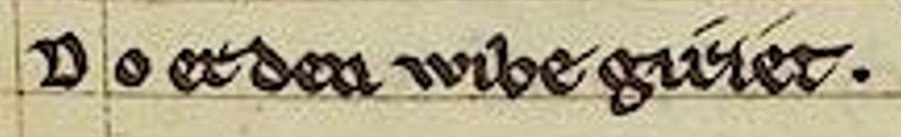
Do er den wibe geriet.
